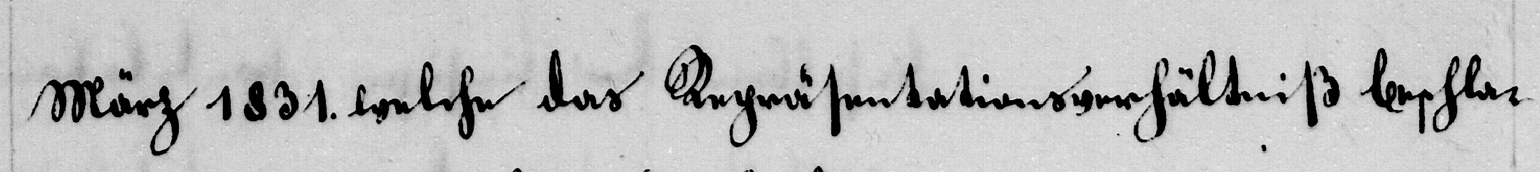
März 1831. welche das Repräsentationsverhältniß beschla¬
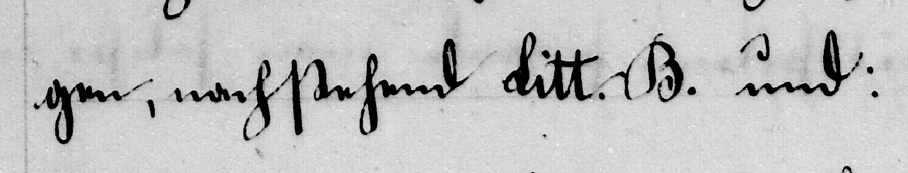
gen, nachstehend Litt. B. und:
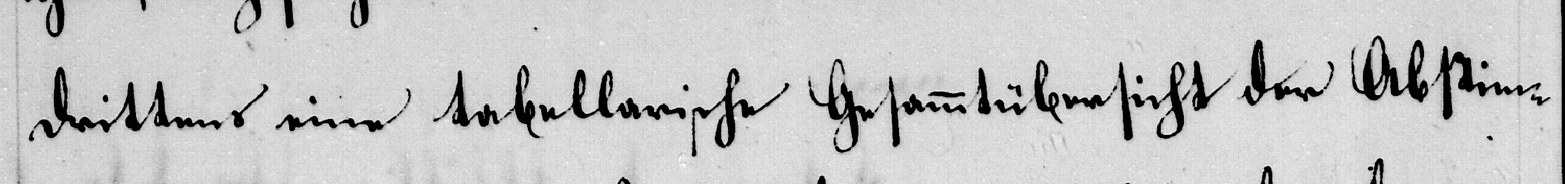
Drittens eine tabellarische Gesammtübersicht der Abstimm¬
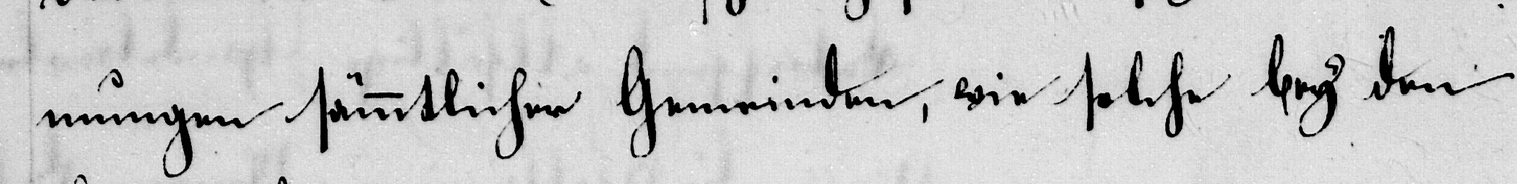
ungen sämmtlicher Gemeinden, wie solche bey den
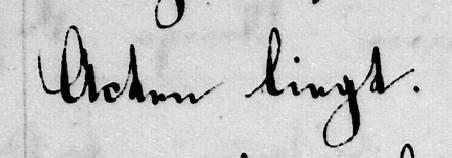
Acten liegt.
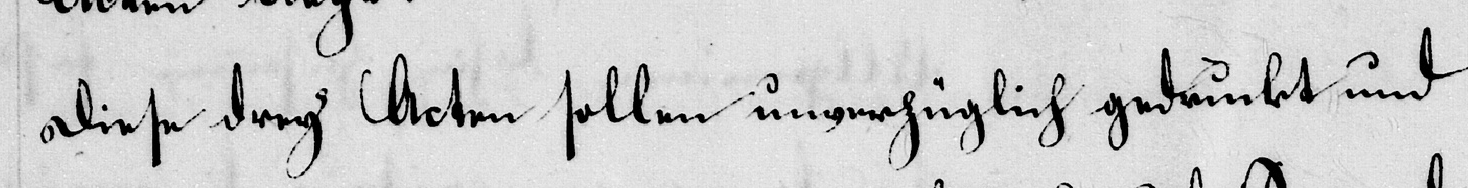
Diese drey Acten sollen unverzüglich gedruckt und
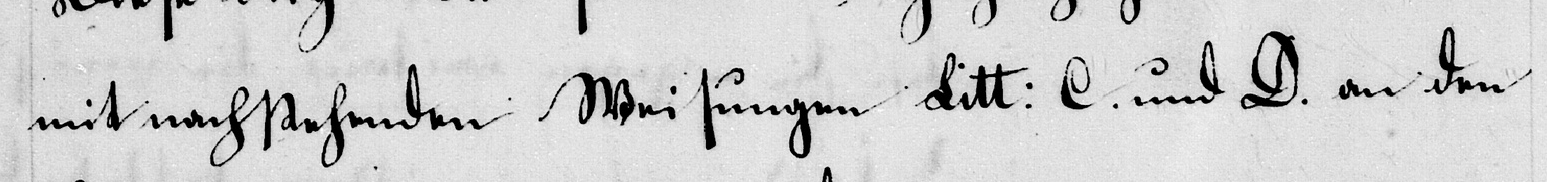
mit nachstehenden Weisungen Litt: C. und D. an den
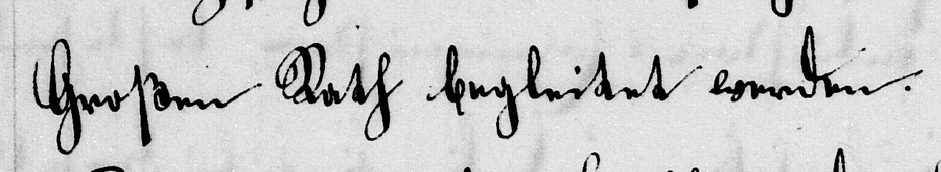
Großen Rath begleitet werden.
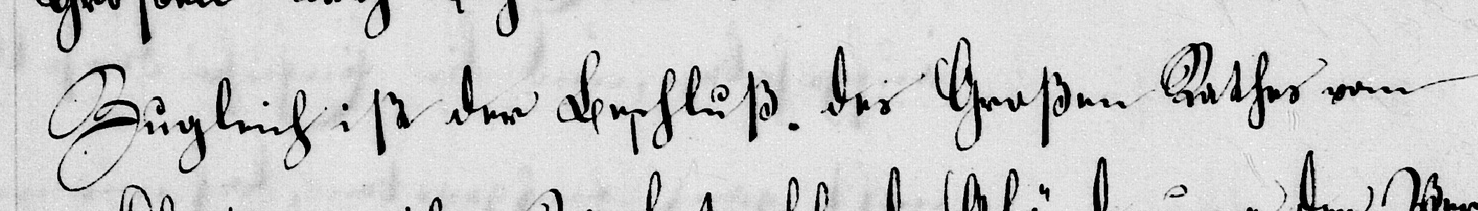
Zugleich ist der Beschluß des Großen Rathes vom
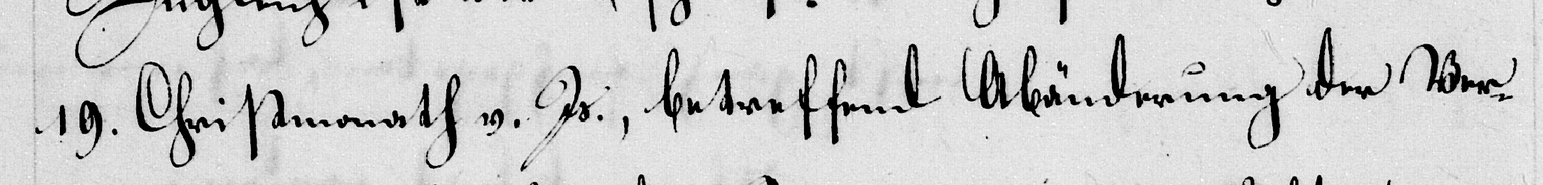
19. Christmonath v. Js., betreffend Abänderung der Ver¬
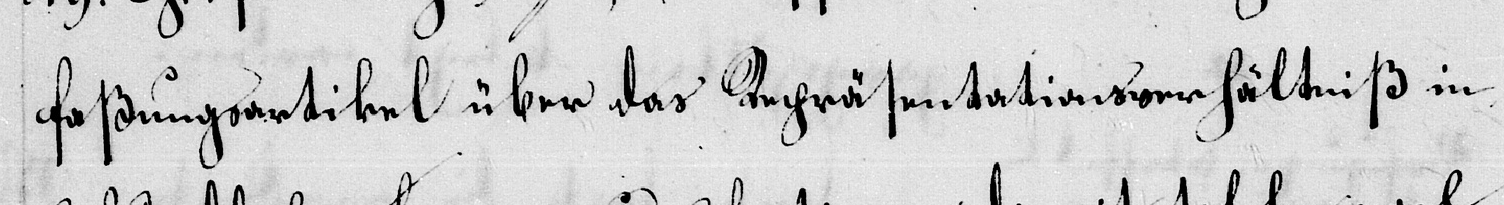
faßungsartikel über das Repräsentationsverhältniß in
